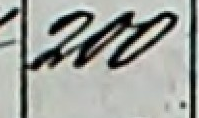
200
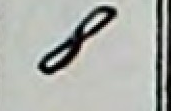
8
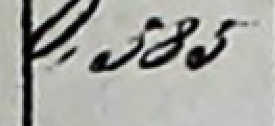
0,585
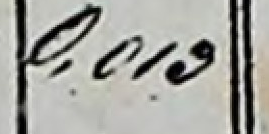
0,013
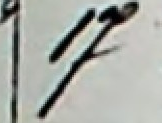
17
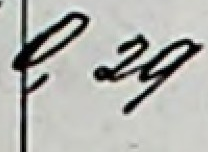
0,29
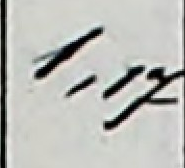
1,17
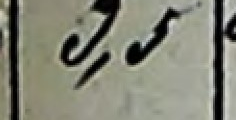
3,5
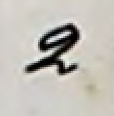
2
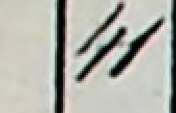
41
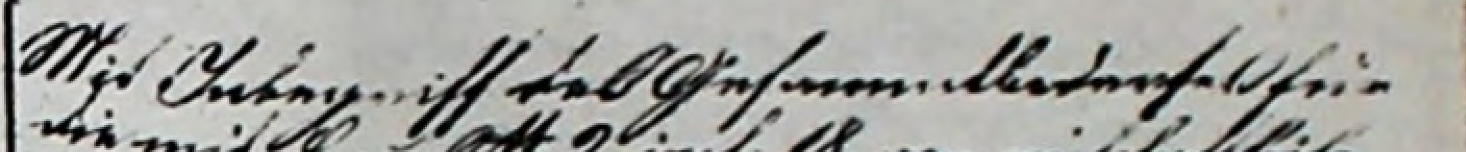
Mit Inbegriff des Gesamtbedarfes für
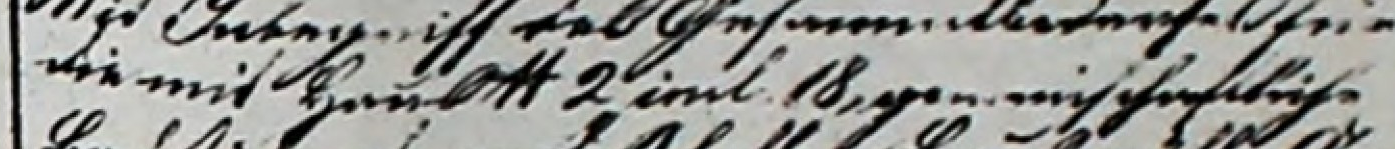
die mit Haus H 2 iml. 18, gen nischaftliche
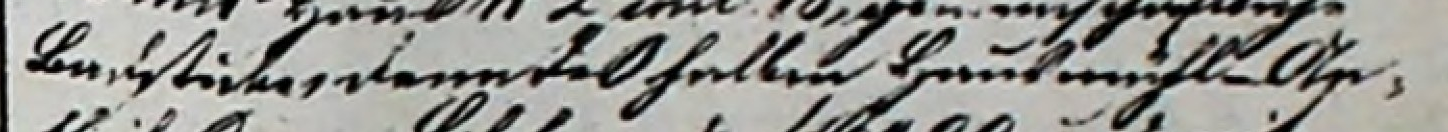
Badstüber dann des halben Hausmühlen An„
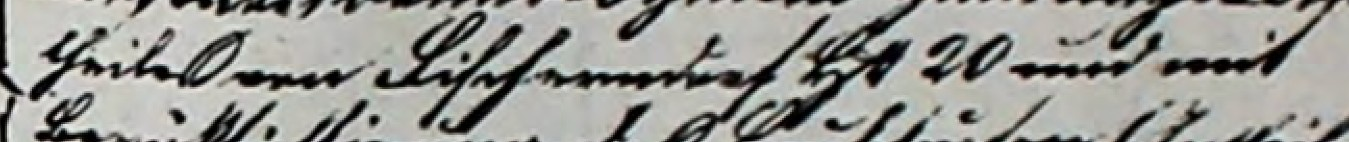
theiles von Fischerndorf H? 20 und mit
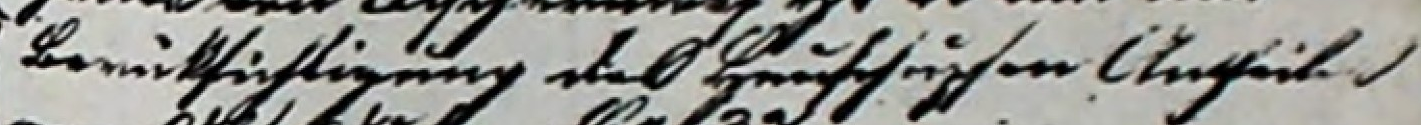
Berücksichtigung des Hauschupsen Antheiles
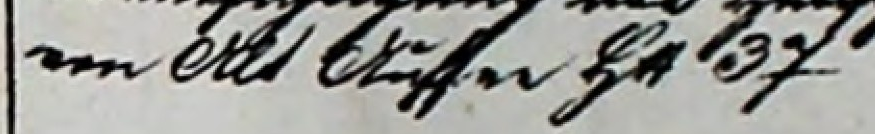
von Alt Aussee H? 37
